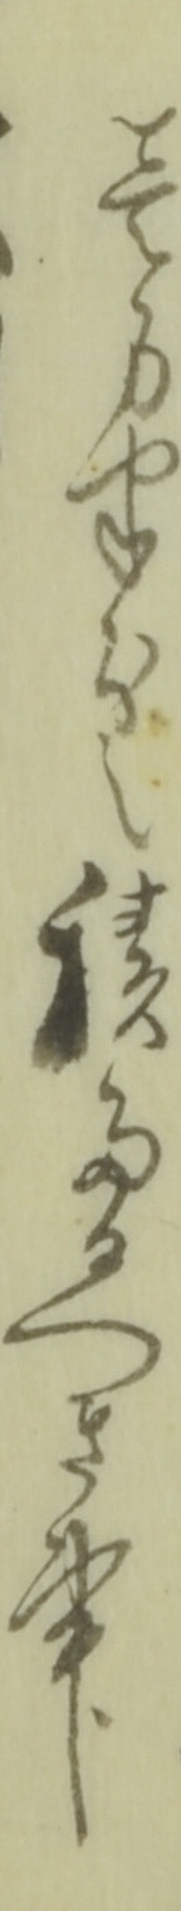壱分半分之積たるへき事
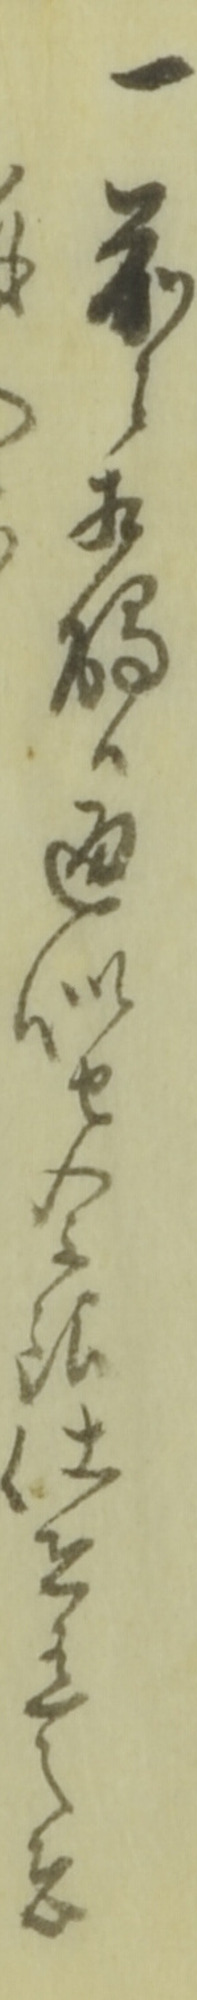一前々相触候通似セ金銀仕者有之者
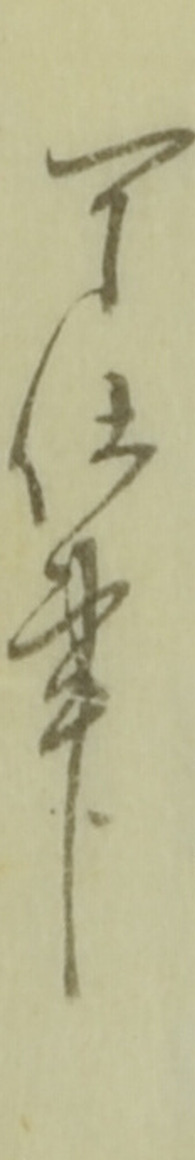可仕事
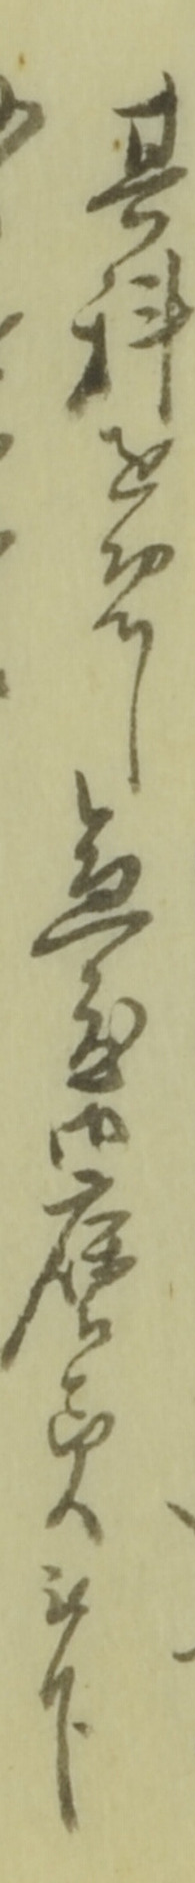其科を免し急度御褒美被下
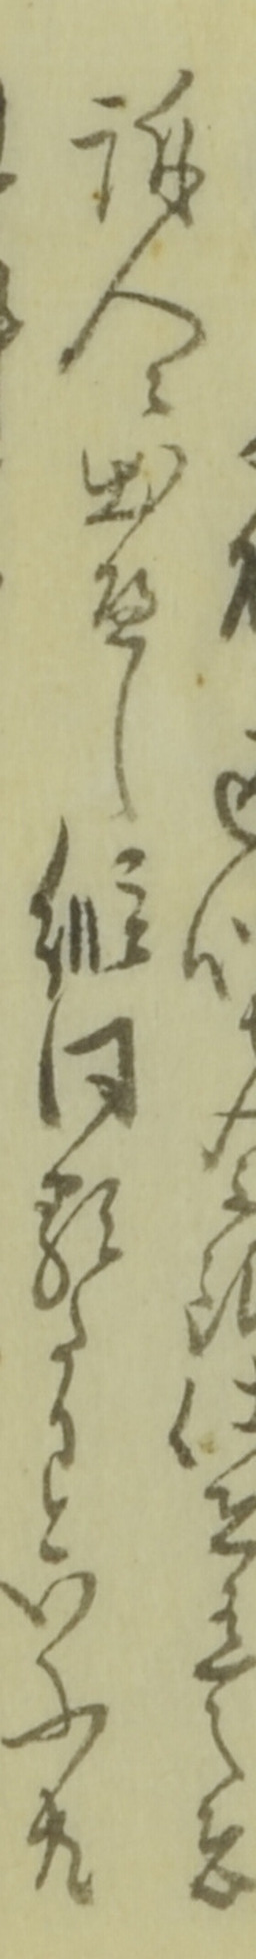訴人ニ出へし縦同類たりといふ共
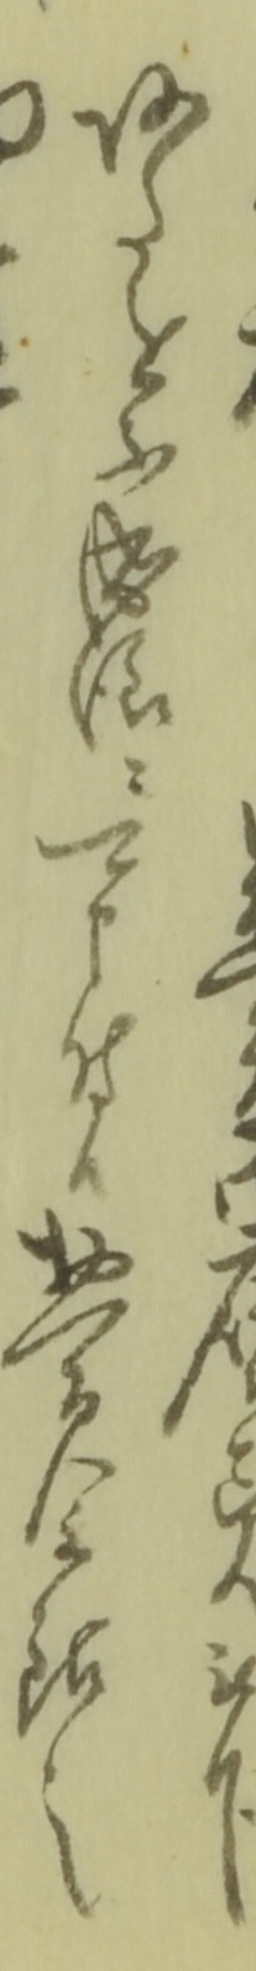あたを不成様ニ可申付候惣而金銀之
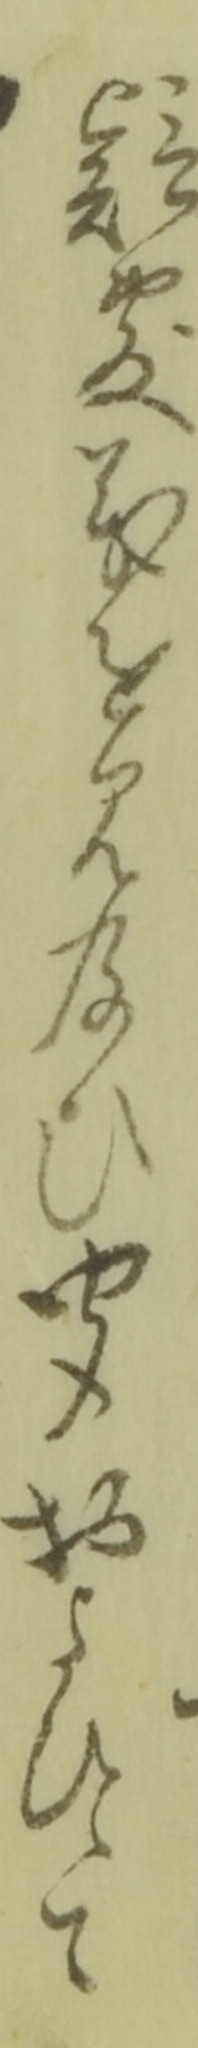疑敷義を見及ひ聞および候ハヽ
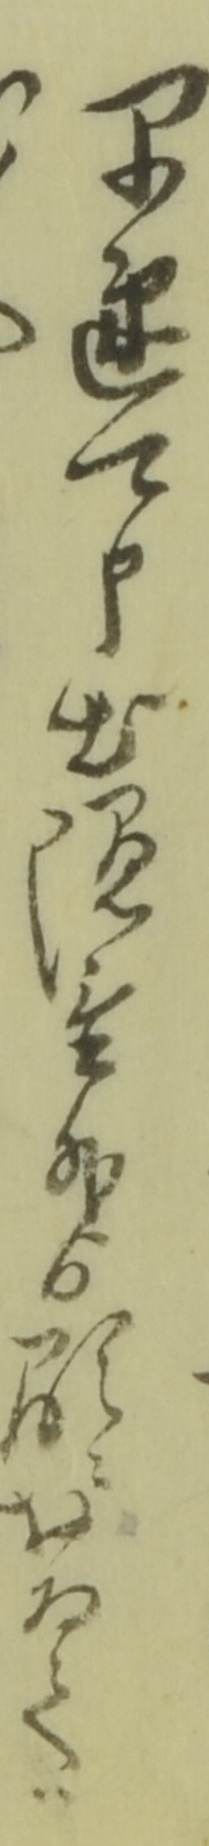早速可申出隠置外ゟ顕ニおゐてハ
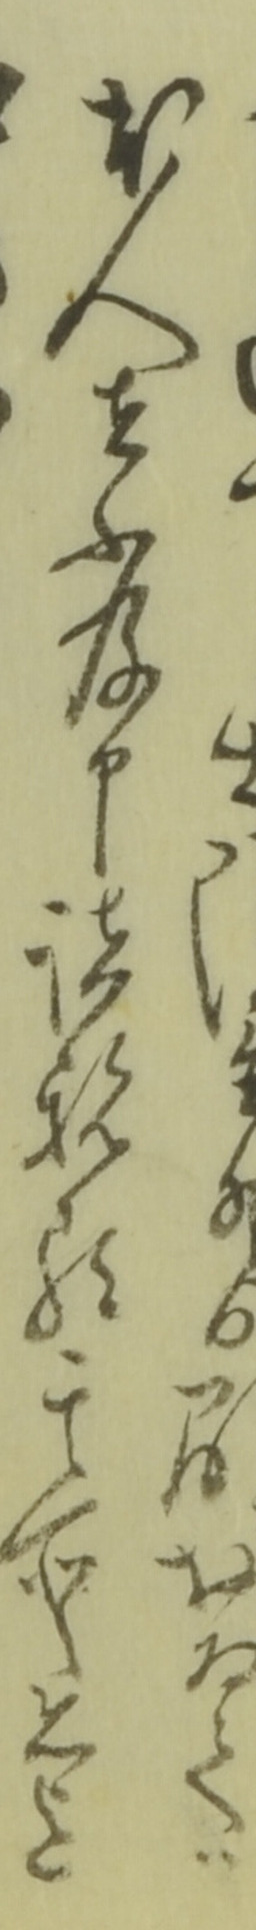本人者不及申諸親類其所之者迄
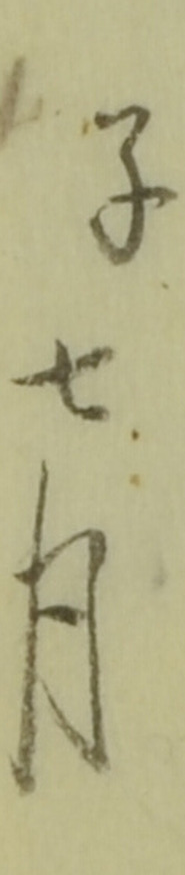子七月

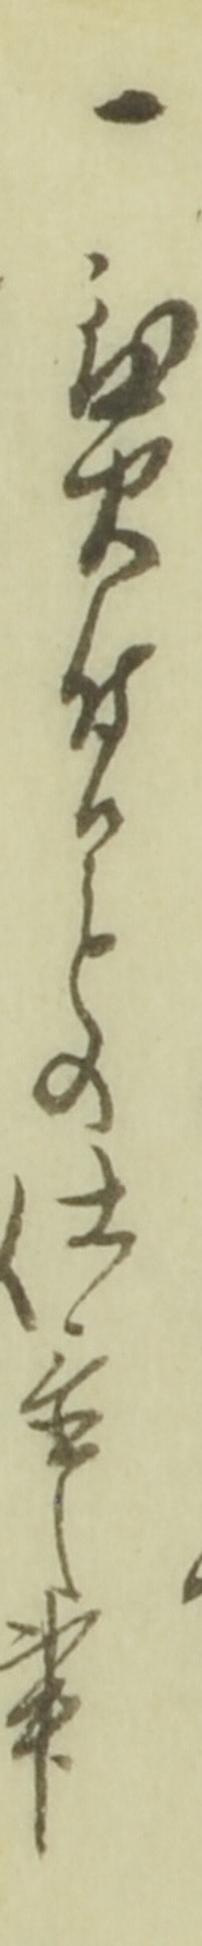一致火付候もの仕置之事
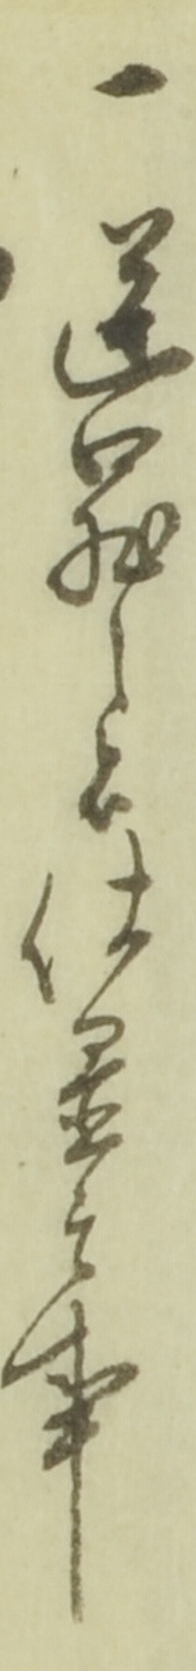一逆罪之者仕置之事
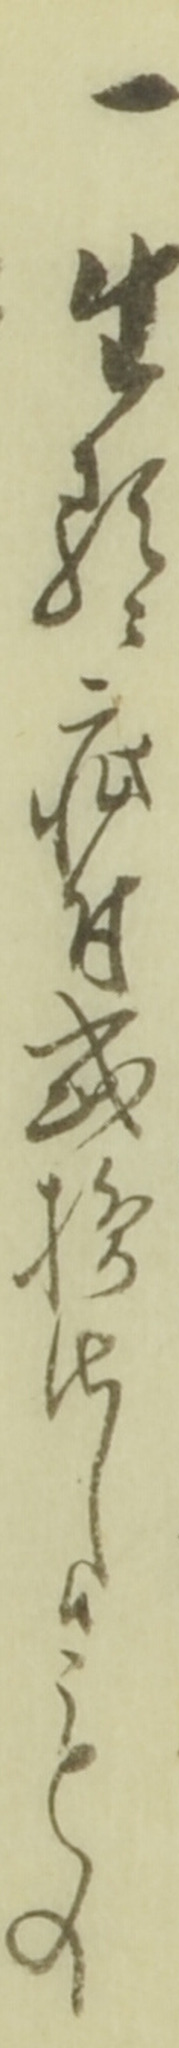一生類ニ疵付或損さし候もの
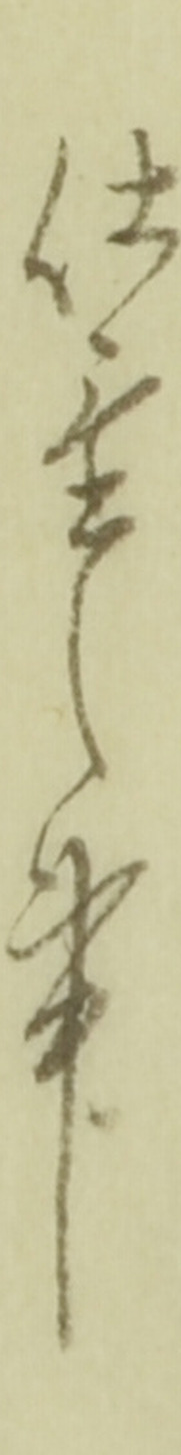仕置之事
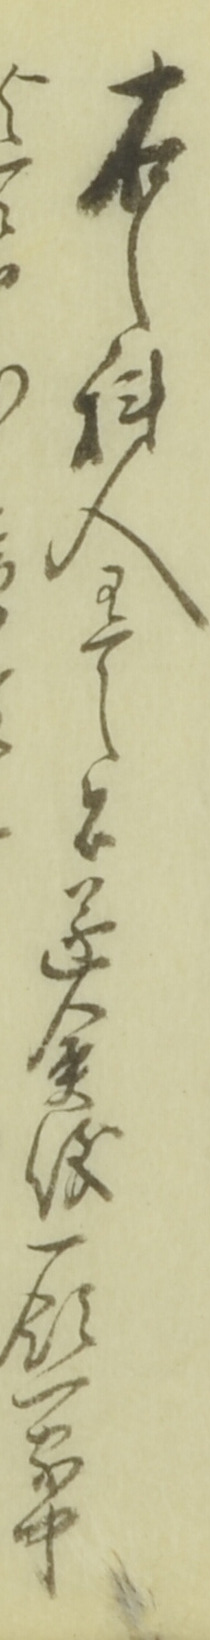右之科人有之者遂僉儀一領一家中
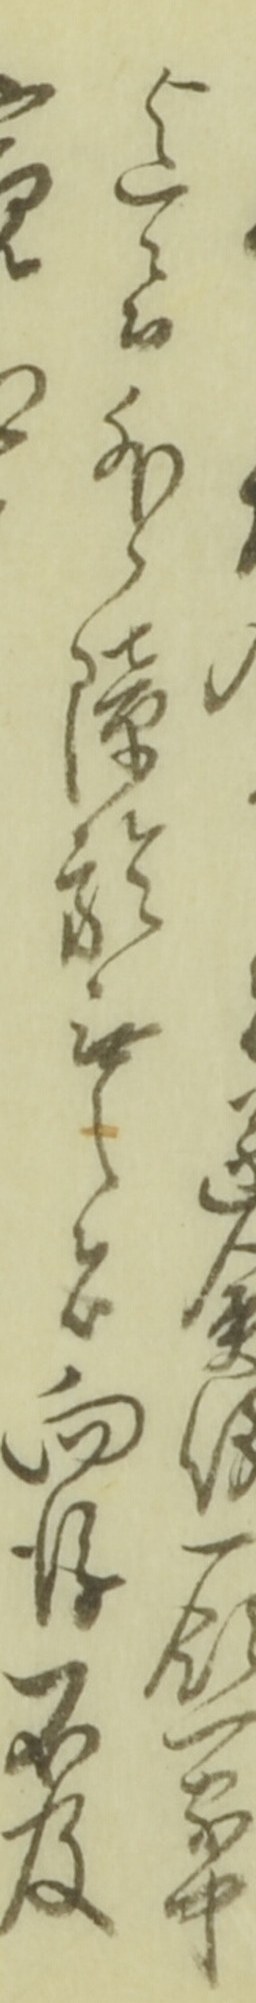迄ニ而外へ障於無之者向後不及
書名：御公儀様御領主様御触書控
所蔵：伊那市立高遠町図書館・合同会社AMANE
